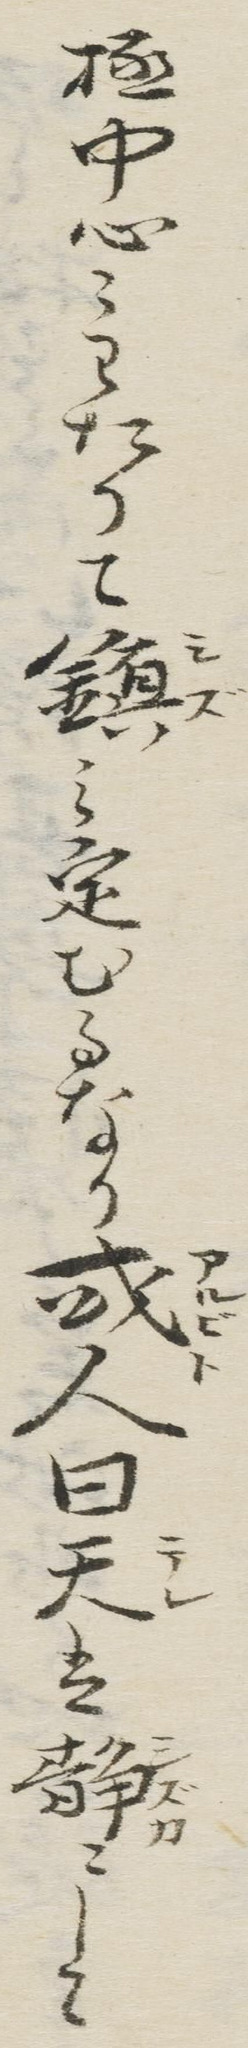極中心ニわたりて鎮ミ定むるなり或人曰天は静ニにして
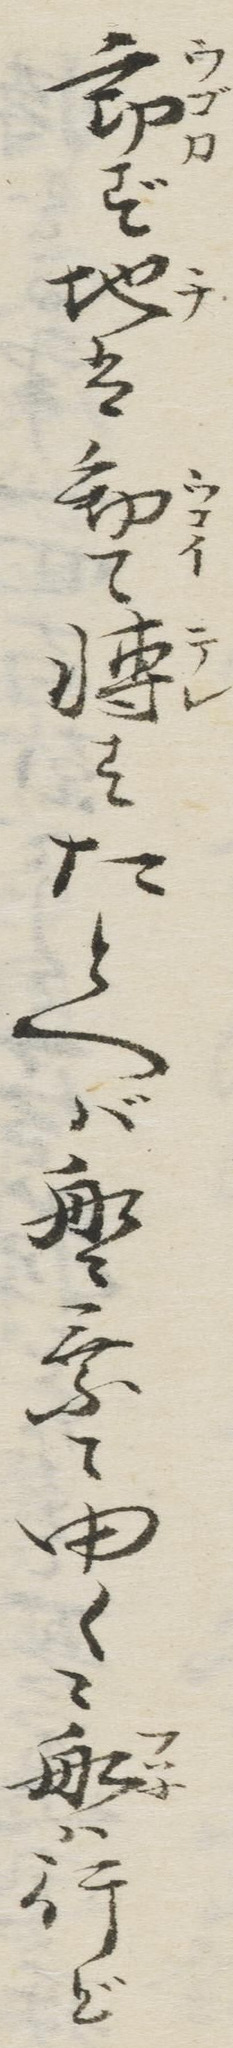動ず地は動て轉すたとへバ船ニ乗てゆくニ船ハ行ど
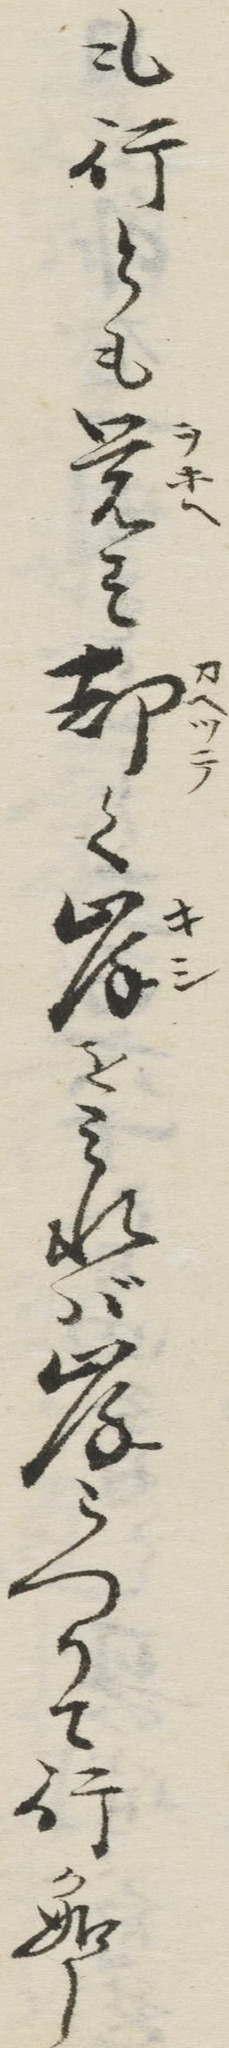も行とも覚す却て岸をミれバ岸ニつりて行ク如し
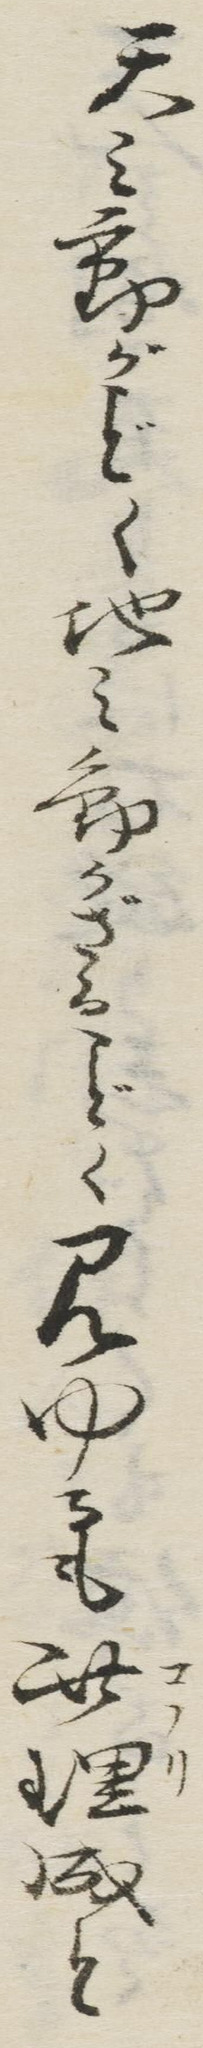天之動がごとく地之動がごとく見ゆるも此理成と
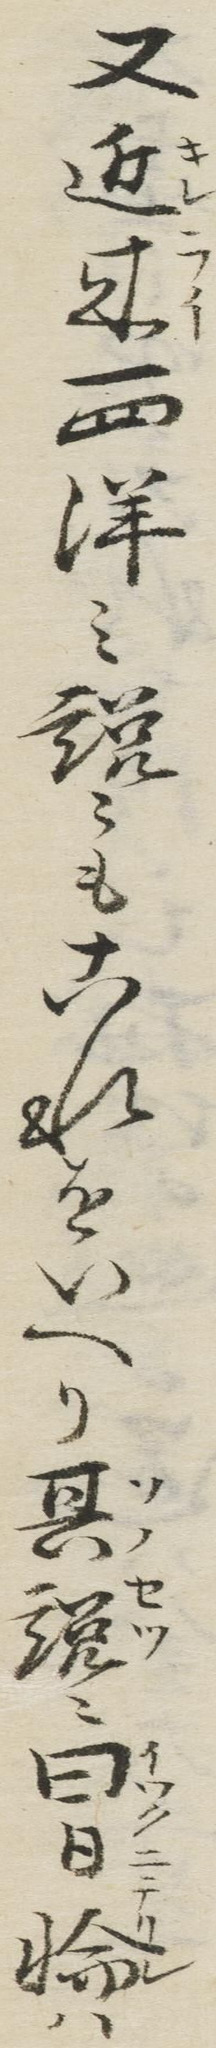又近来西洋の説ニもこれをいへり其説ニ曰日輪ハ

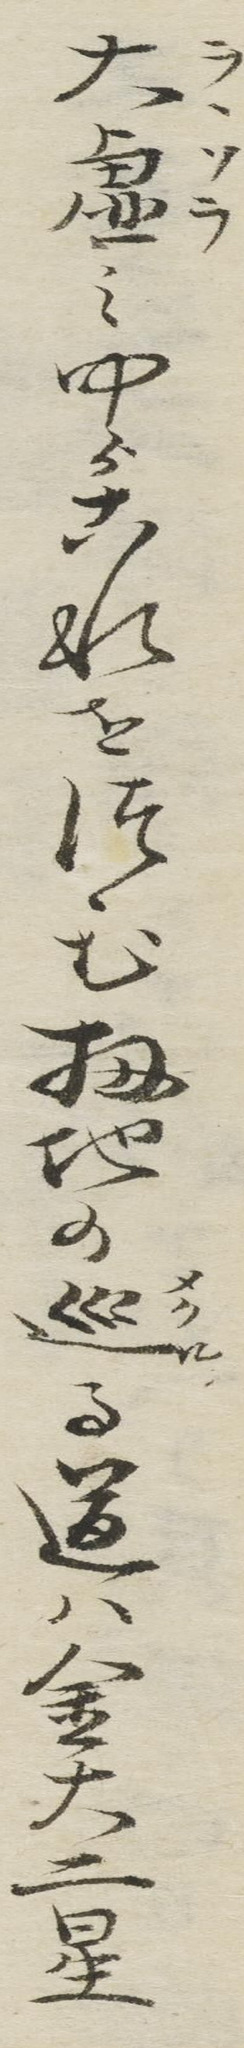大虚之中ゟこれをとむ扨地の巡る道ハ金大ニ星
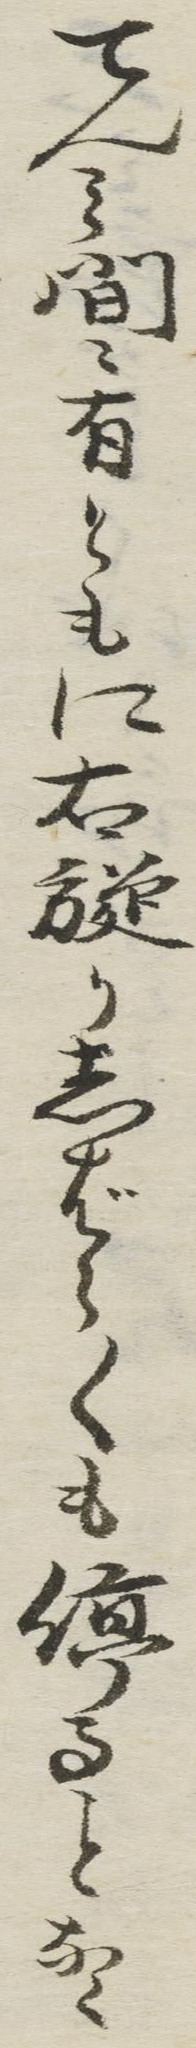てん之天之間ニ有ともに右旋りしば〳〵も停るとなく
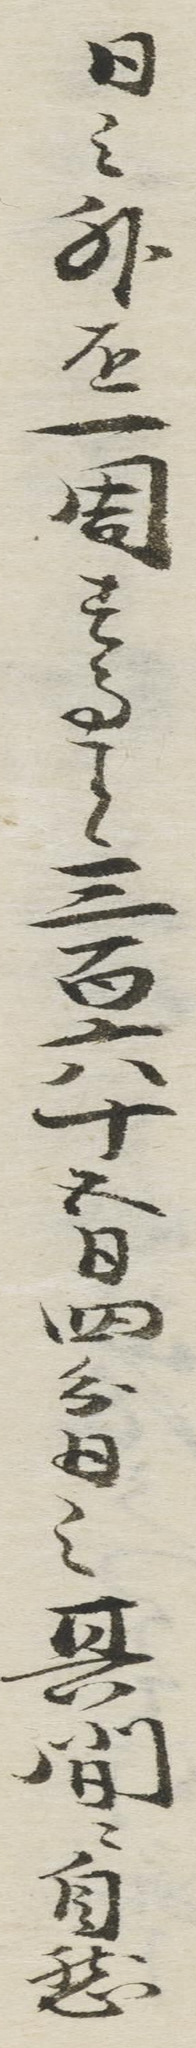日々外を一周すること三百六十五日四分日之其間ニ自然
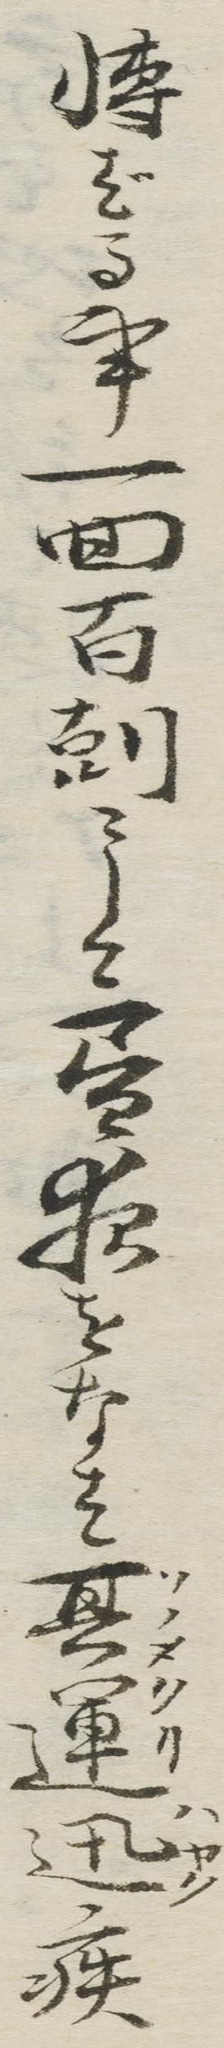轉ずる事一回百剋ニして昼夜をなす其運迅疾
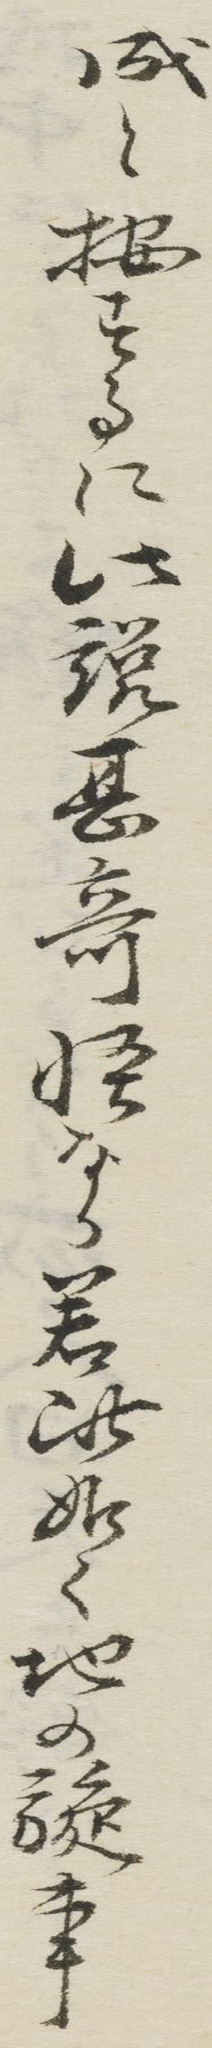成と按ずるに此説甚奇怪なり若此如く地の旋事
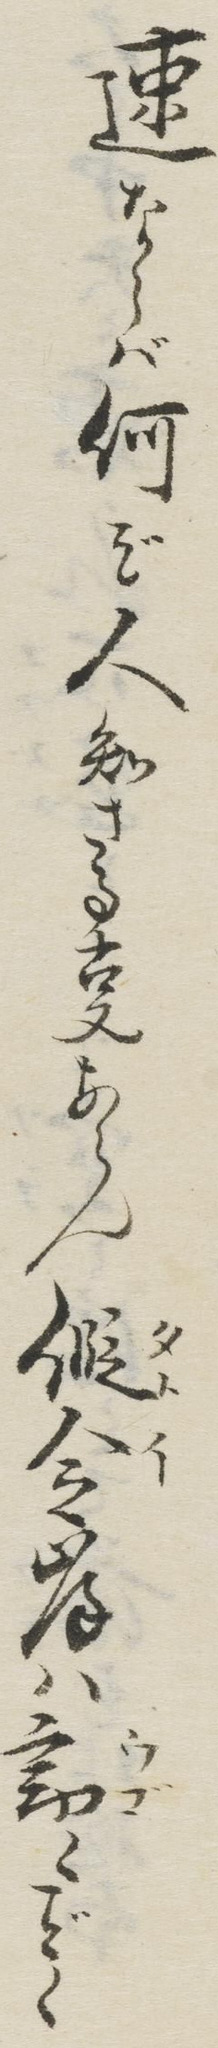速ならバ何ぞ人知さる事あらん假令岸ハ動くごとく
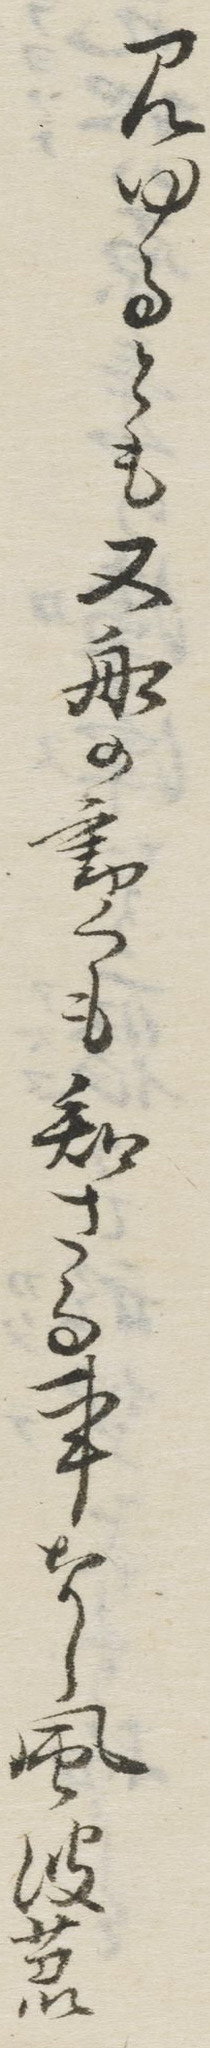見ゆるとも又船の動くも知さる事なり風波荒
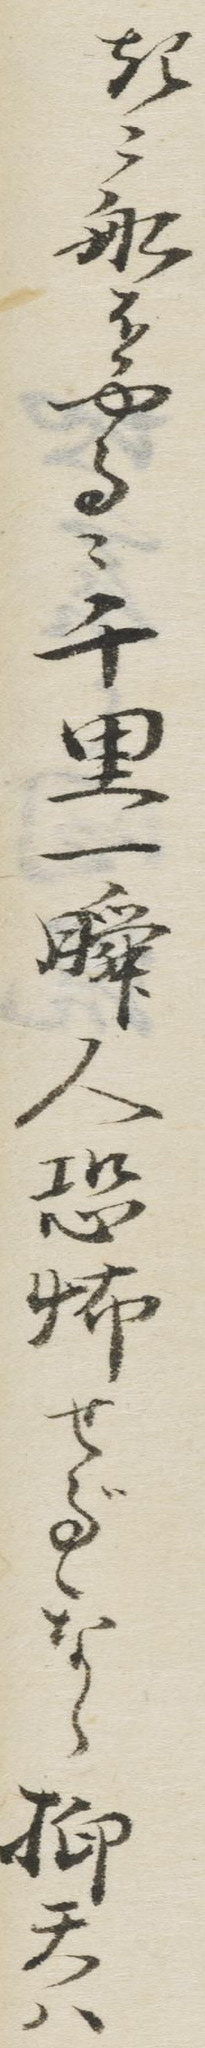起ニ船をやるニ千里一瞬人恐怖せなり抑天ハ
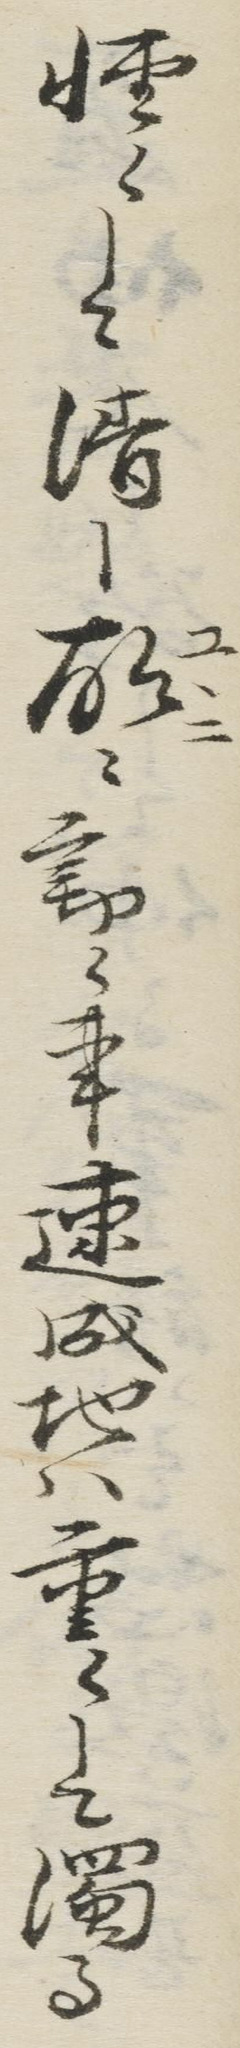軽くして清し故ニ動く事早成地ハ重くして濁る
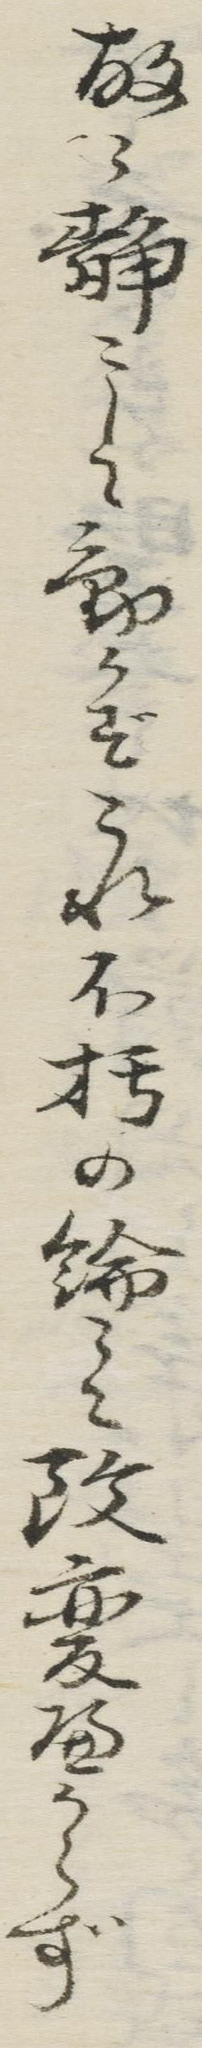故ニ静ニして動かずこれ不朽の綸ニて改変べからず
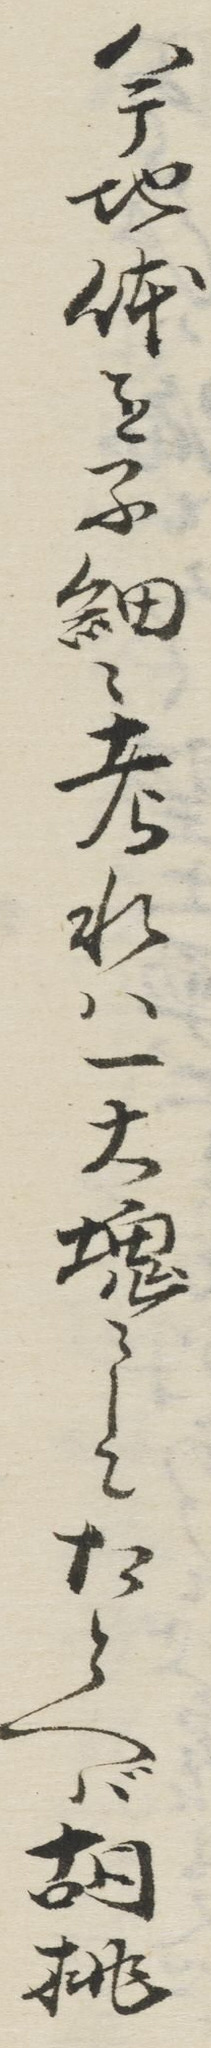今地体を子細ニ考れハ一大塊ニしてたとへば胡桃
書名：諸国大地震大津波一代記
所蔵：東京大学地震研究所図書室 Earthquake Research Institute Library, The University of Tokyo, JAPAN
